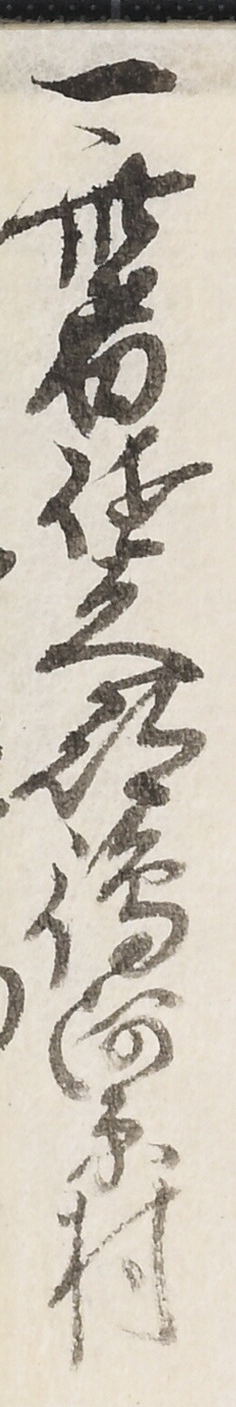一此者佐久郡島河原村
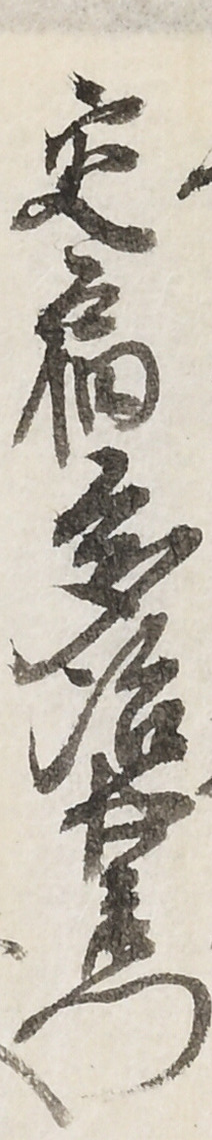定宿多治右衛門
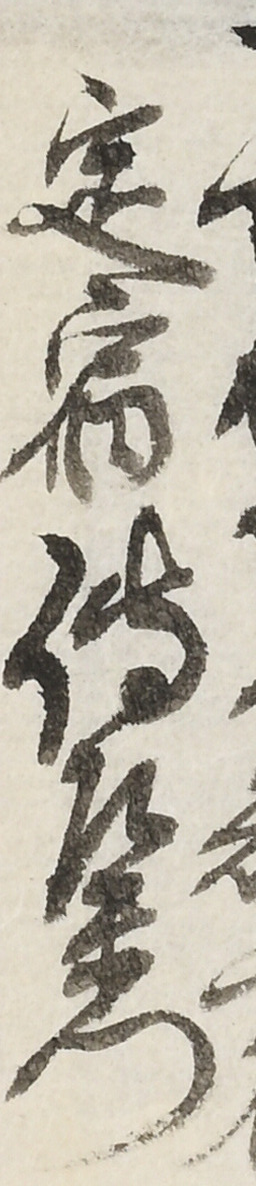定宿伝左衛門
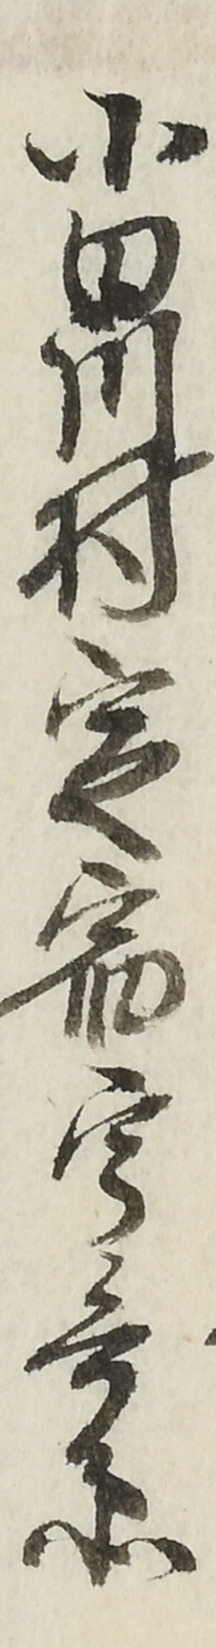小田川村定宿宇兵衛
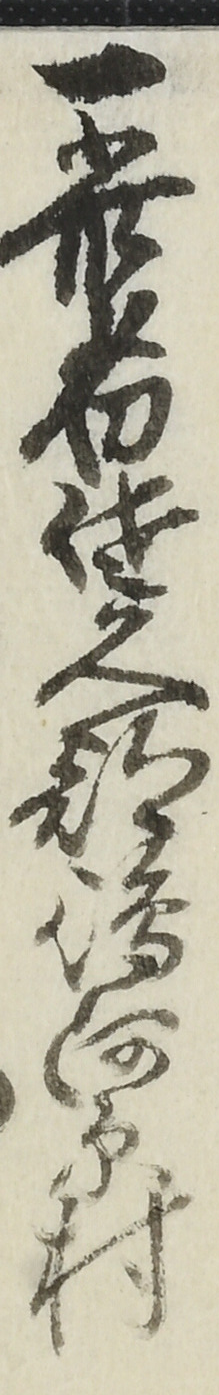一此者佐久郡島河原村
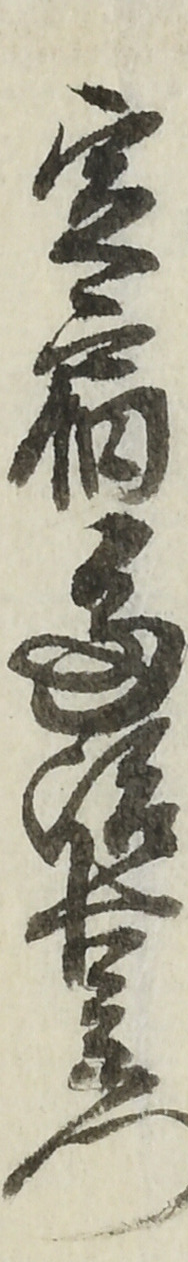定宿多治右衛門

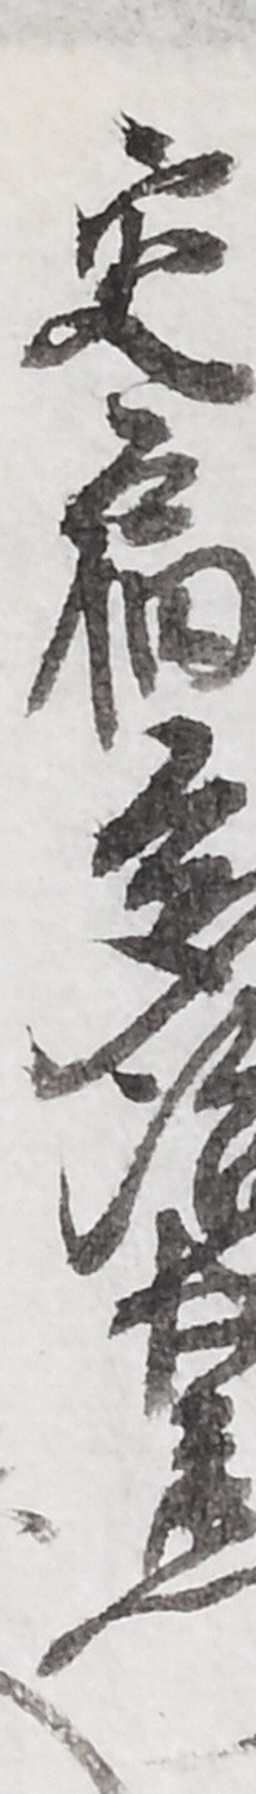定宿多治右衛門
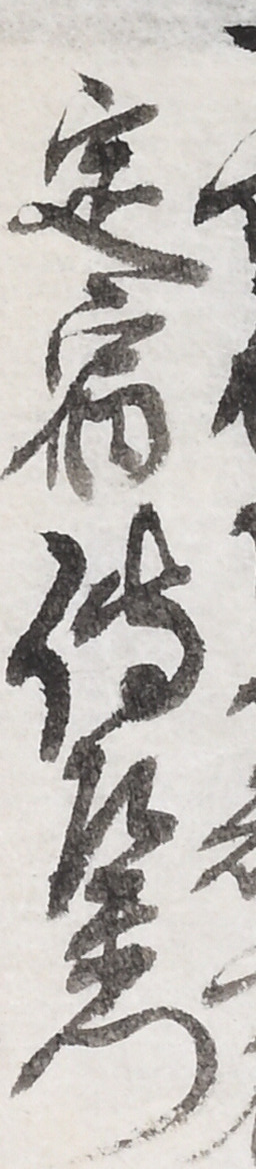定宿伝左衛門
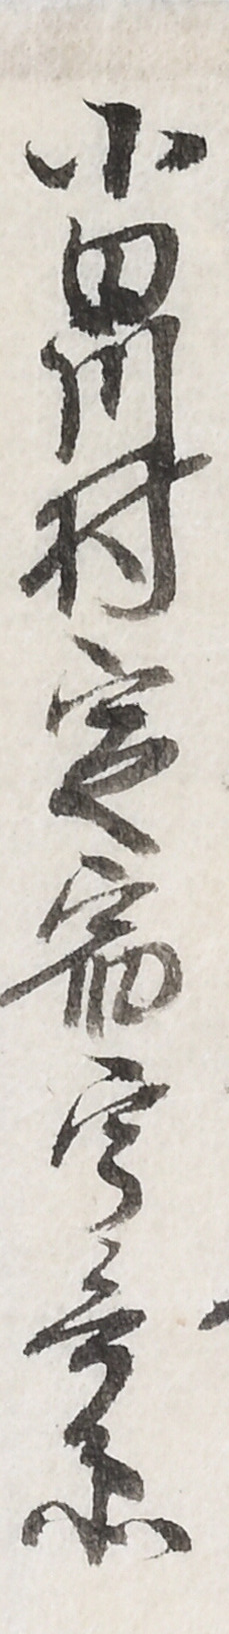小田川村定宿宇兵衛
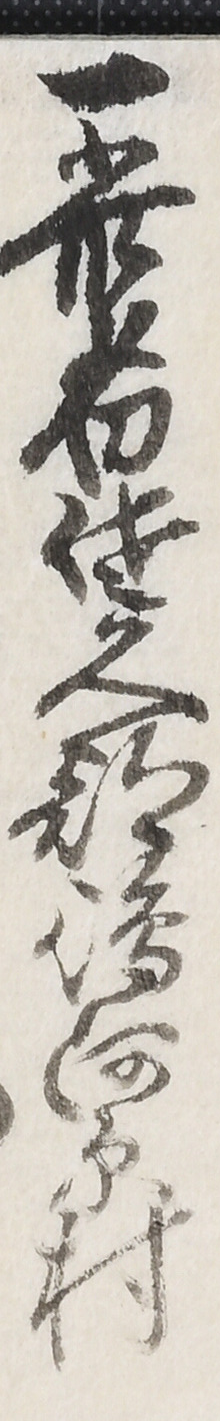一此者佐久郡島河原村
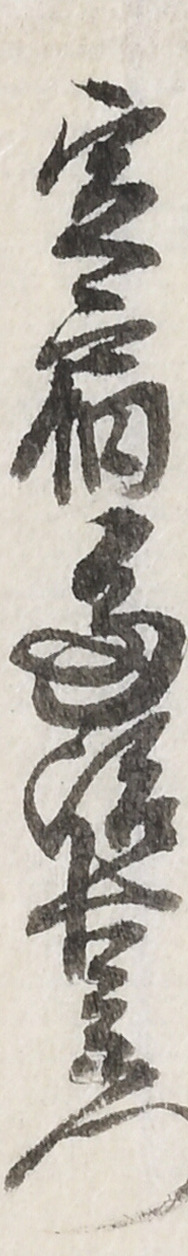定宿多治右衛門
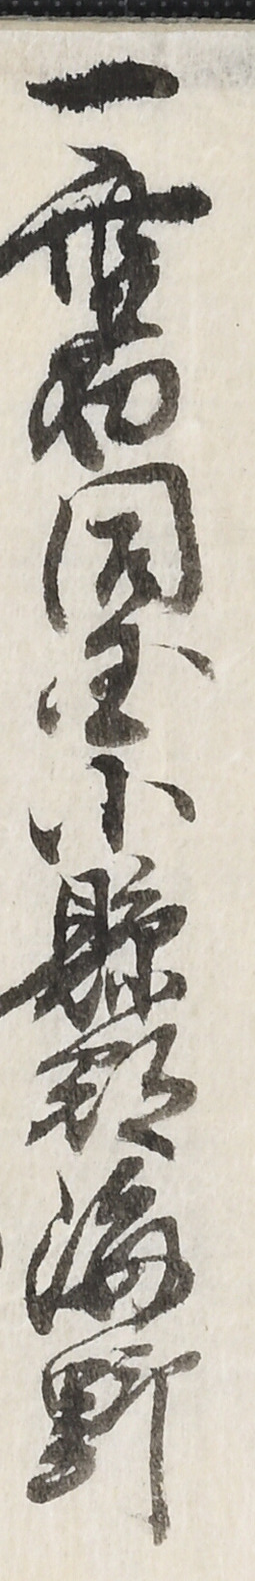一此者同国小県郡海野
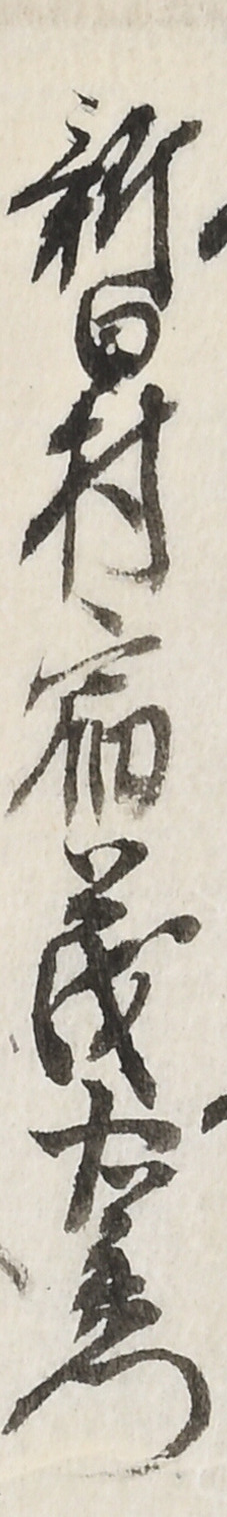新田村宿茂右衛門
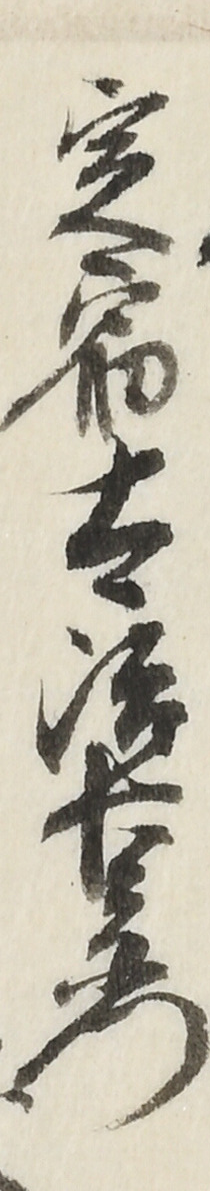定宿太治右衛門

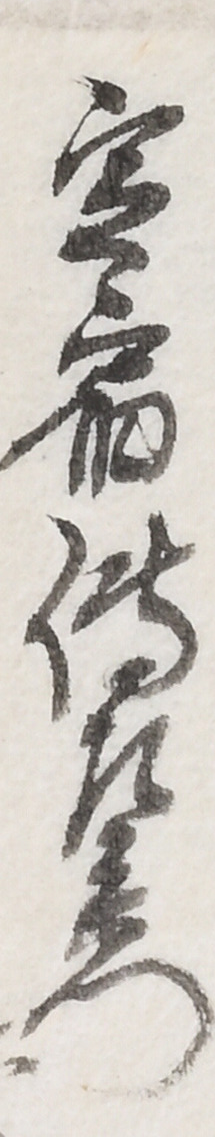定宿伝左衛門
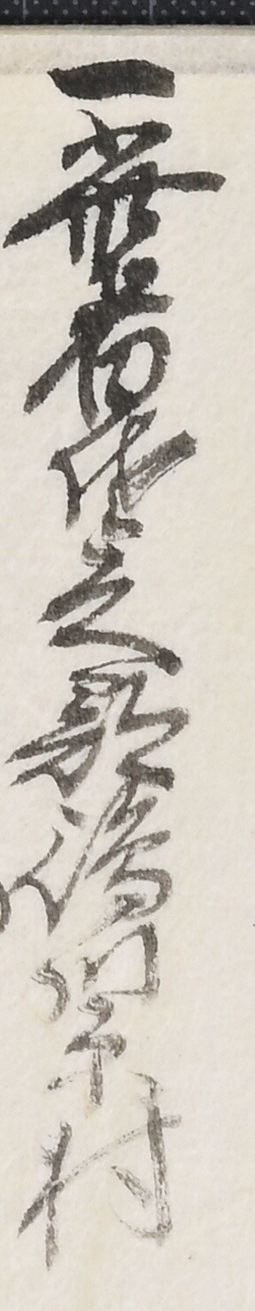一此者佐久郡島川原村
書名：安政七庚申年正月他国石切名前書上帳
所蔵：伊那市立高遠町図書館・合同会社AMANE
